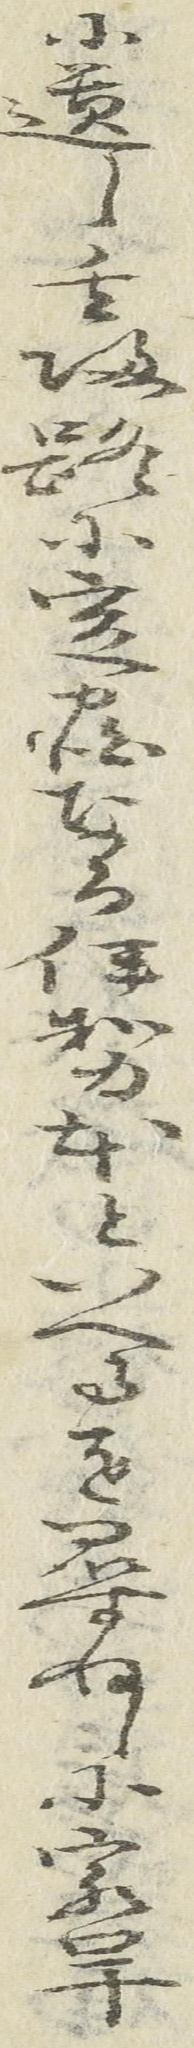に遺し其帰路に定宿なる伊勢本といへるを尋ねしに最早
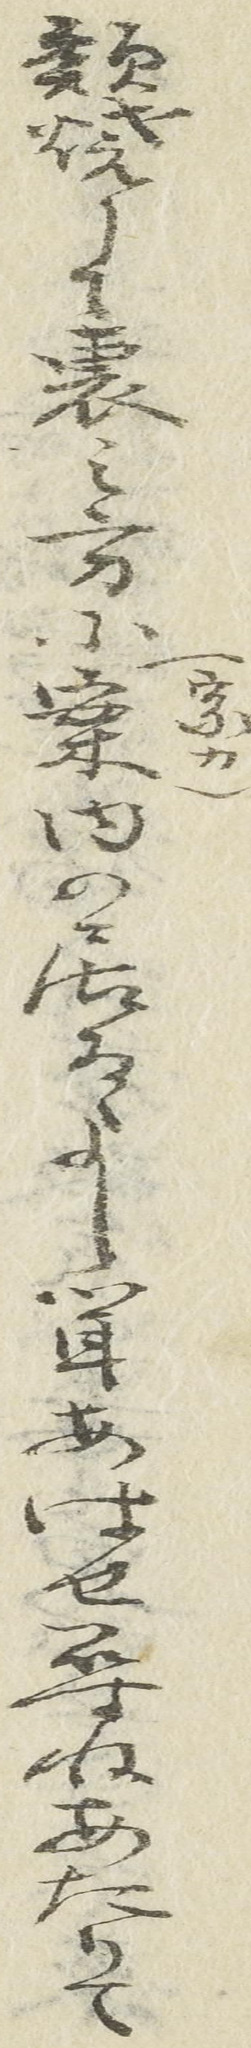類焼して裏之方に案内の居るよし聞あはせ尋ねあたりて
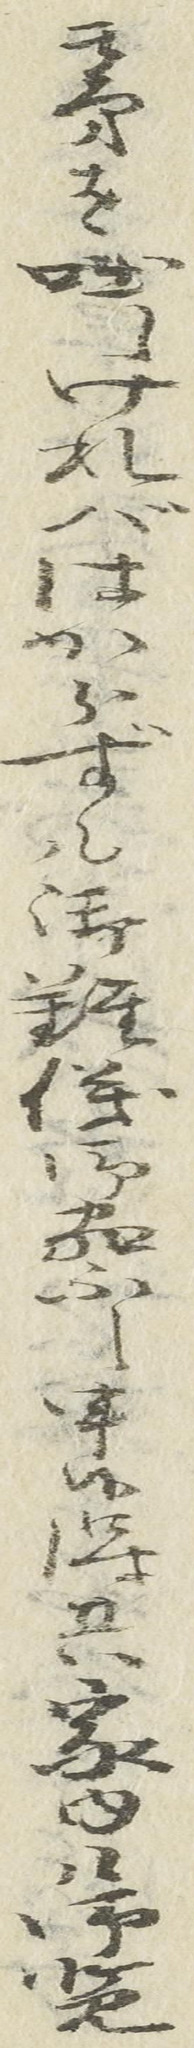私大を吐しけれバはからずも御難儀御察し申候得共家内も御覧
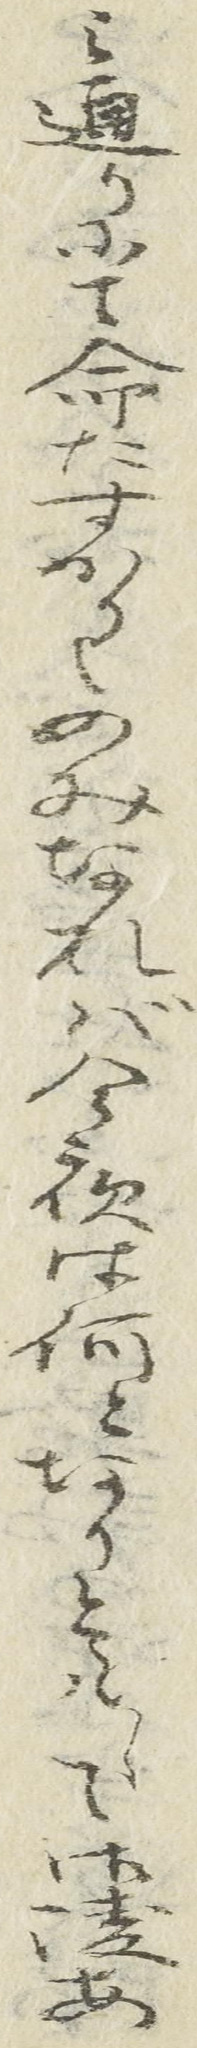之通りにて命たすかりしのみなれバ今夜は何となりともして御凌あ
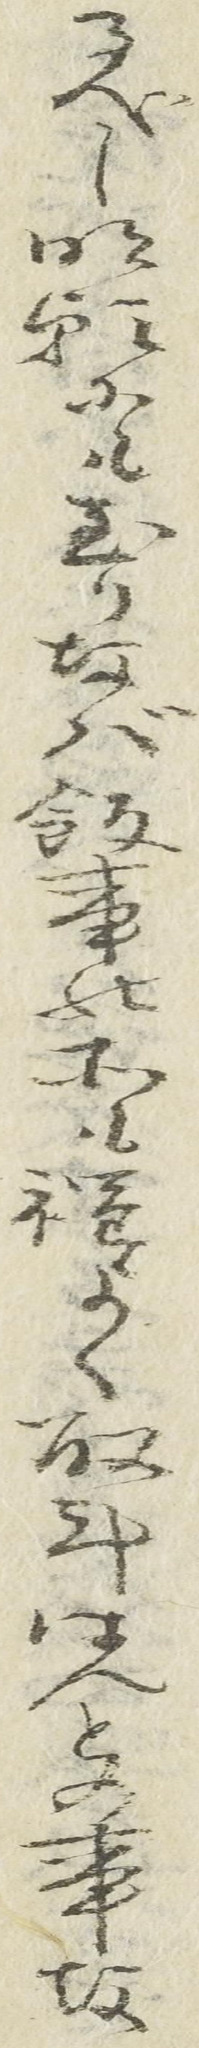るべし明朝にも至りなバ飯事の所も程よく取計はんとの事な
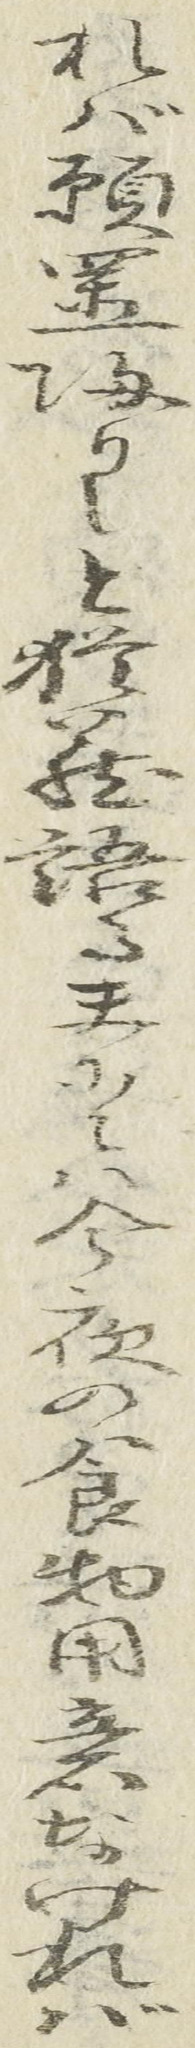れば頼置帰りしと樽蔵語る夫にてハ今夜の食物用意なけれバ
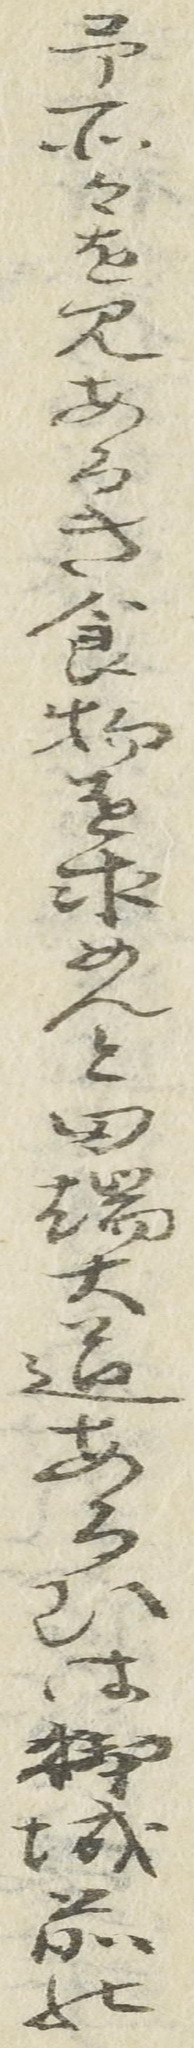予所々を見あるき食物を求めんと田端大道あるひは御城前の
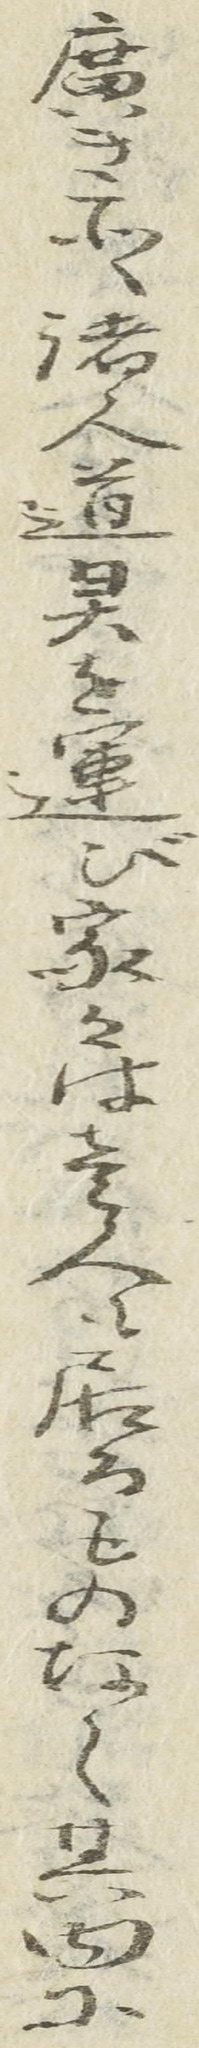広き所へ諸人道具を運び家々は壱人も居るものなく其内に
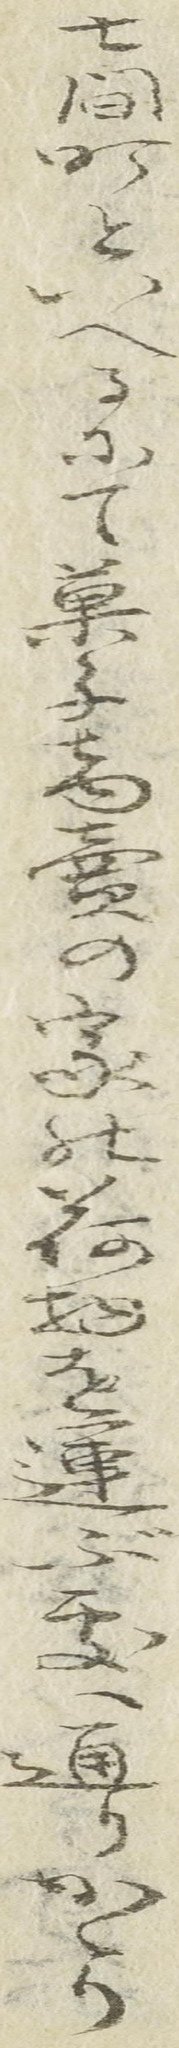七間町といへるにて菓子商売の家の荷物を運ぶ處へ通りかゝり
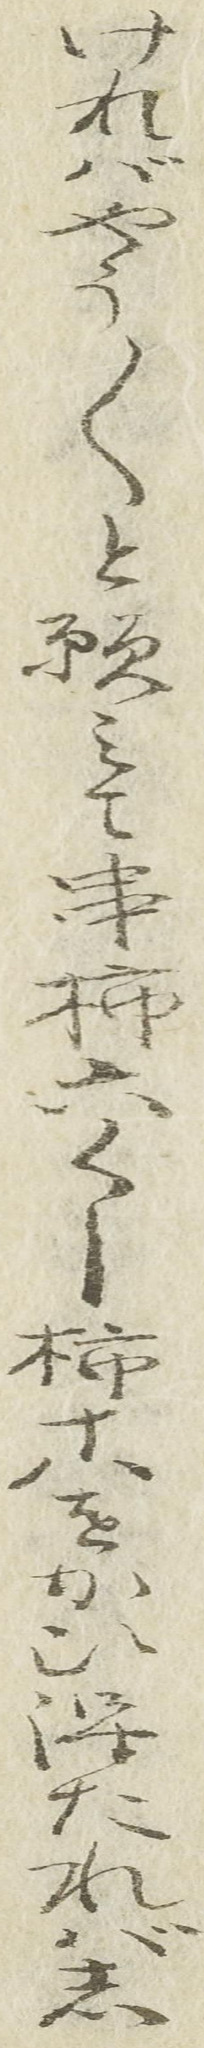けれバやう〳〵と願之て串柿六くし柿十八をかひ得たれバし
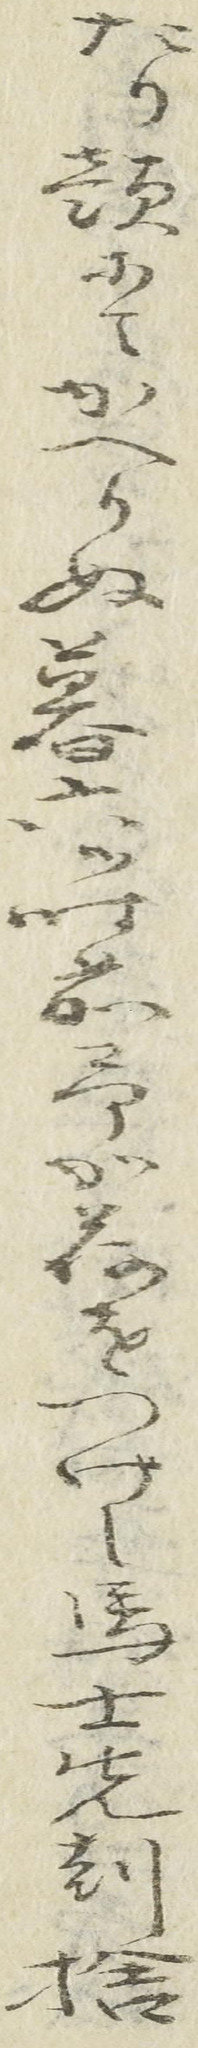たり顔にてかへりぬ暮六ツ時前予か荷をつけし馬士先刻捨
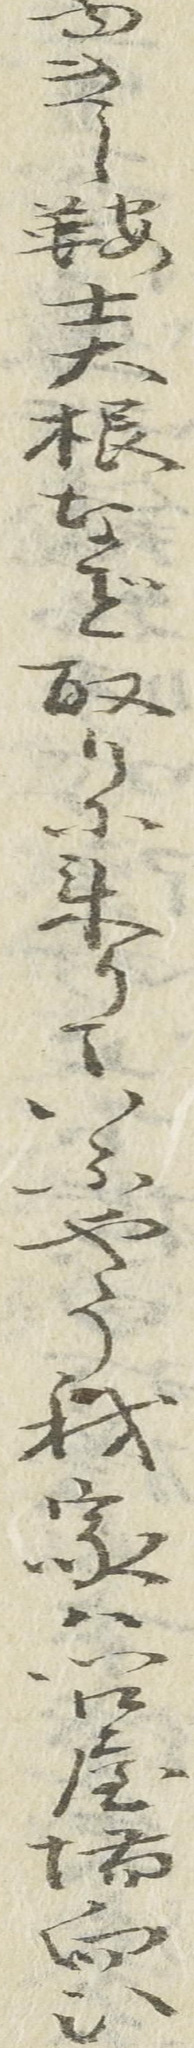ゆきし鞍土大根など取りに来りていふや我家ハ問屋場向ひ
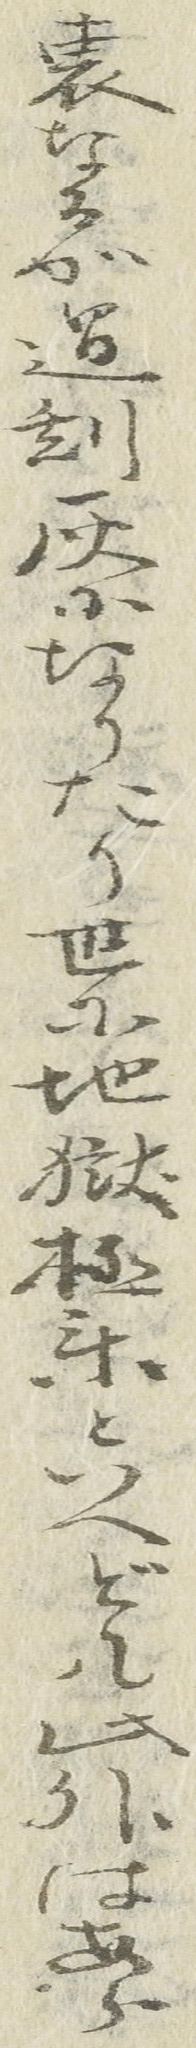裏なるが過刻灰になりたり世に地獄極楽といへども此外はあら
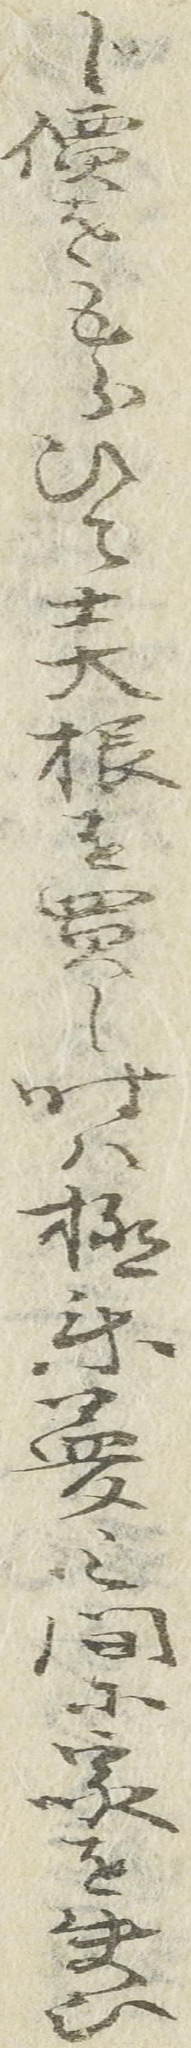じ価をもらひて土大根を買し時は極楽夢之間に家を失ひ
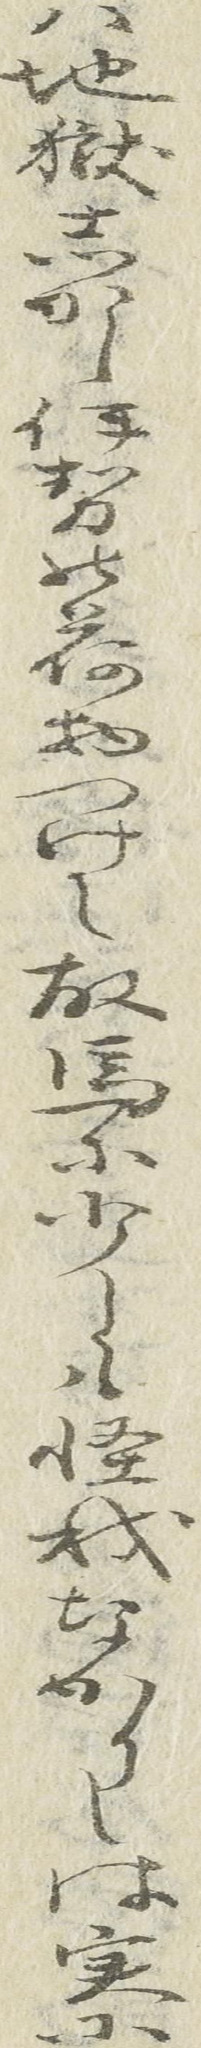ハ地獄しかし伊勢の荷物つけし故馬に少しも怪我なかりしは実に
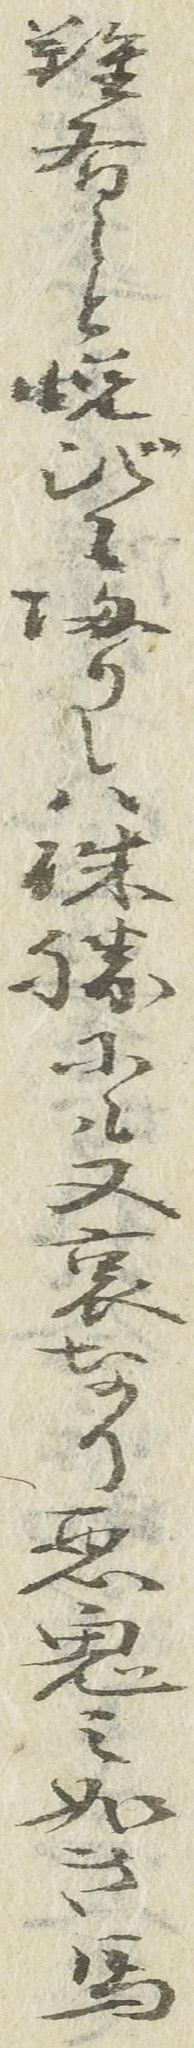難有しと悦びて帰りしハ殊勝にも又哀なり悪鬼之如き馬
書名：地震前兆集　全
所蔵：東京大学地震研究所図書室 Earthquake Research Institute Library, The University of Tokyo, JAPAN
